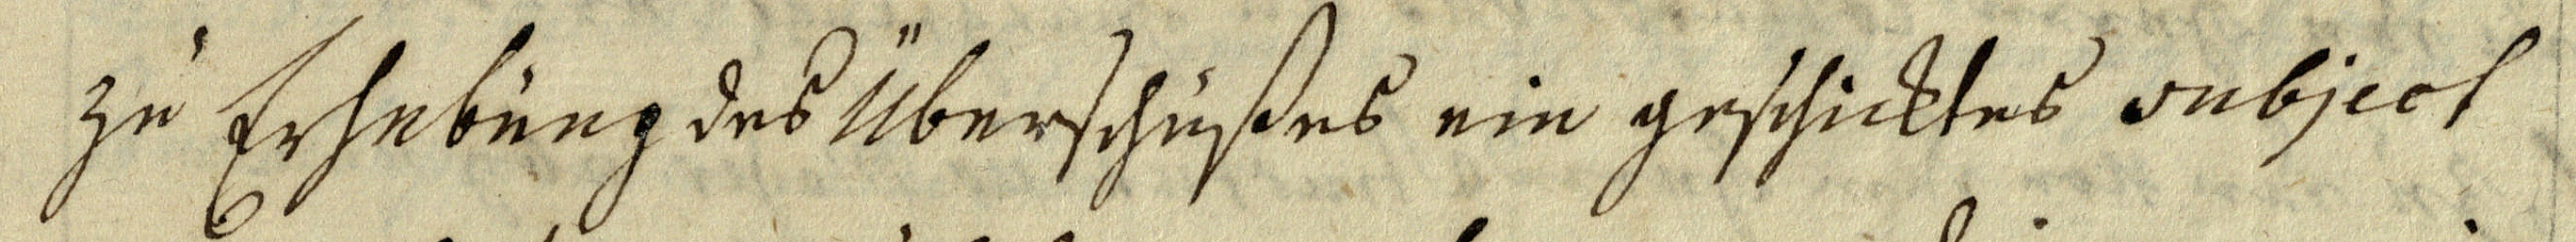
zu Erhebung des Überschußes ein geschicktes subject
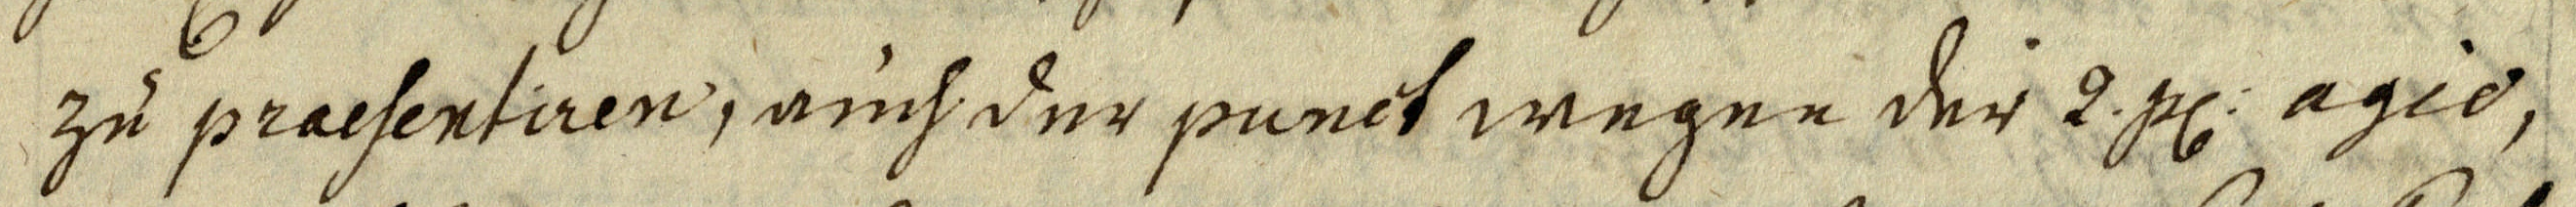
zu praesentiren, auch der punct wegen der 2.p.: agio,
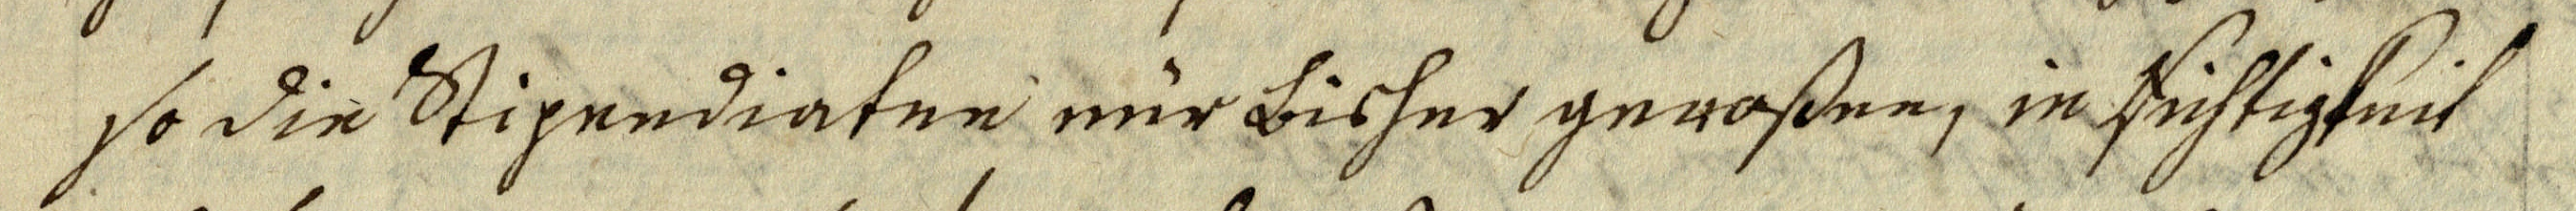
so die Stipendiaten nur bisher genoßen, in Richtigkeit
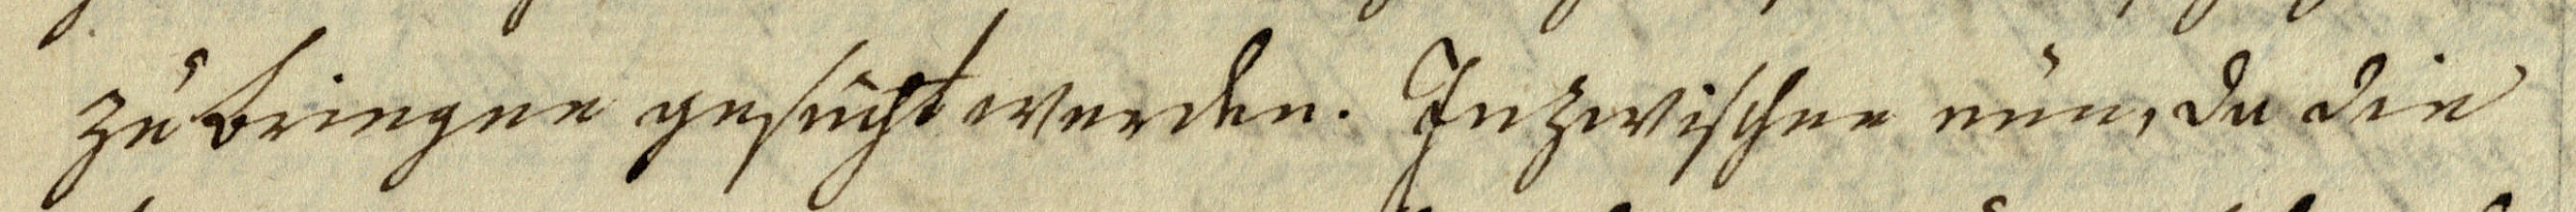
zu bringen gesucht werden. Inzwischen nun, da die
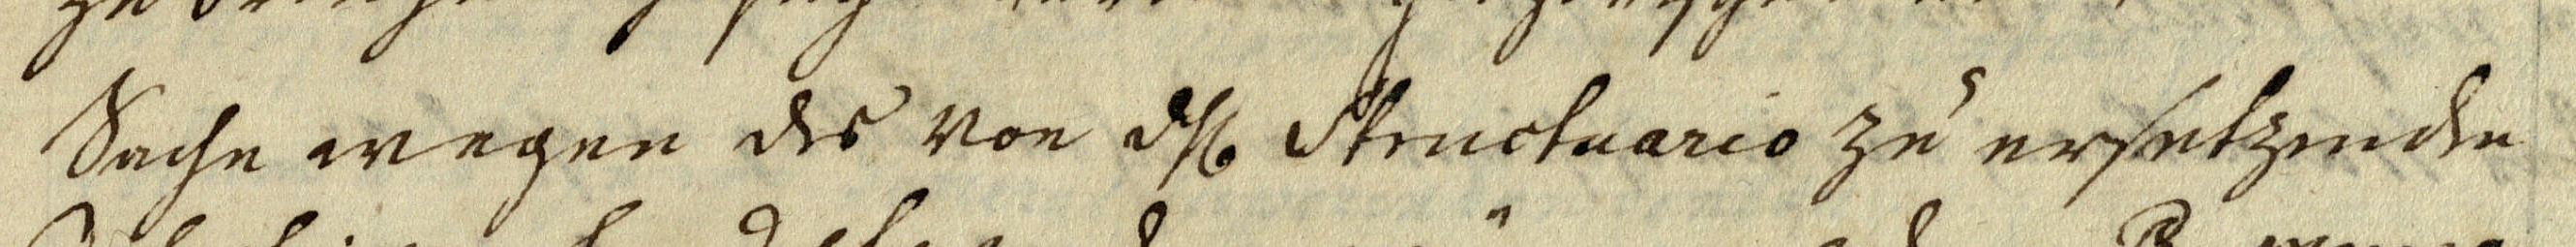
Sache wegen der von dH Structuario zu ersetzenden
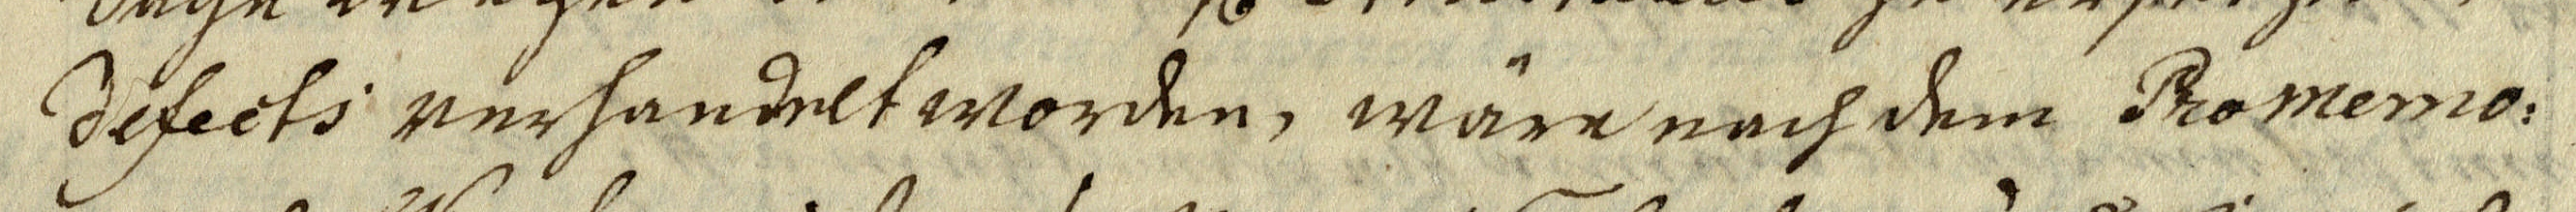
defects verhandelt worden, wäre nach dem Promemo¬
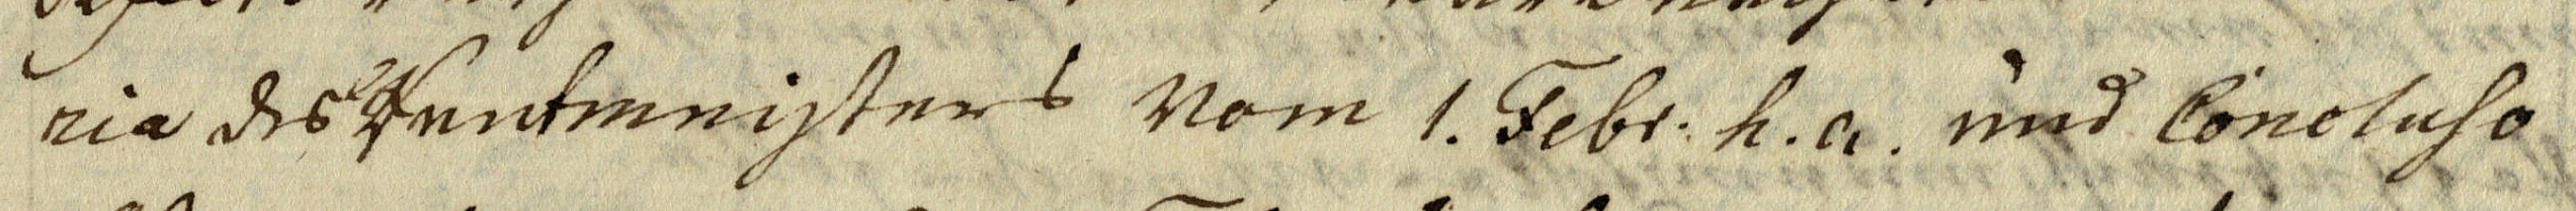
ria des Rentmeisters vom 1. Febr. h. a. und Concluso
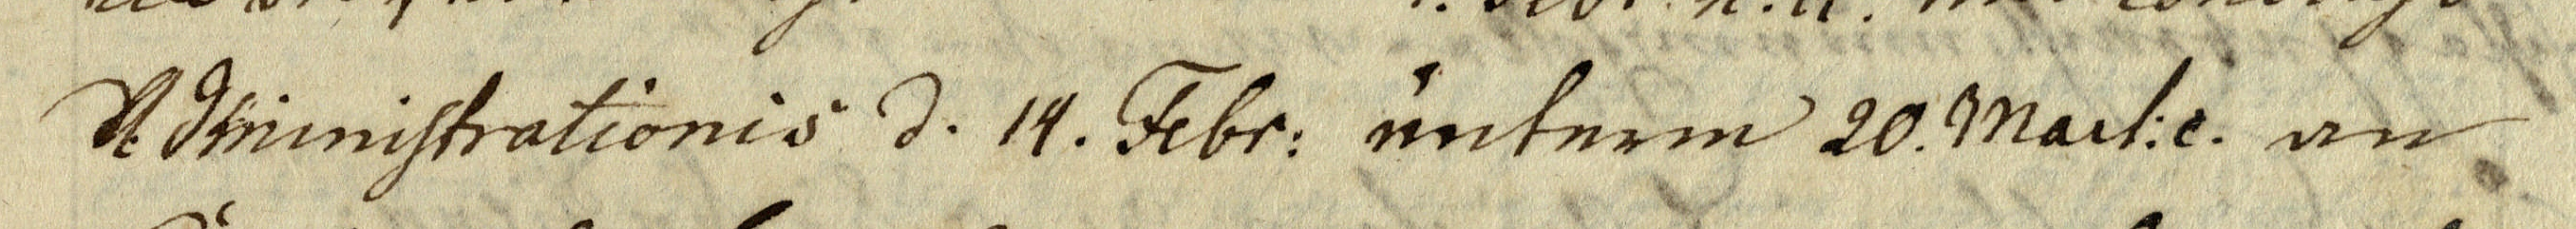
S. Administrationis d. 14. Febr. unterm 20. Mart. e. an
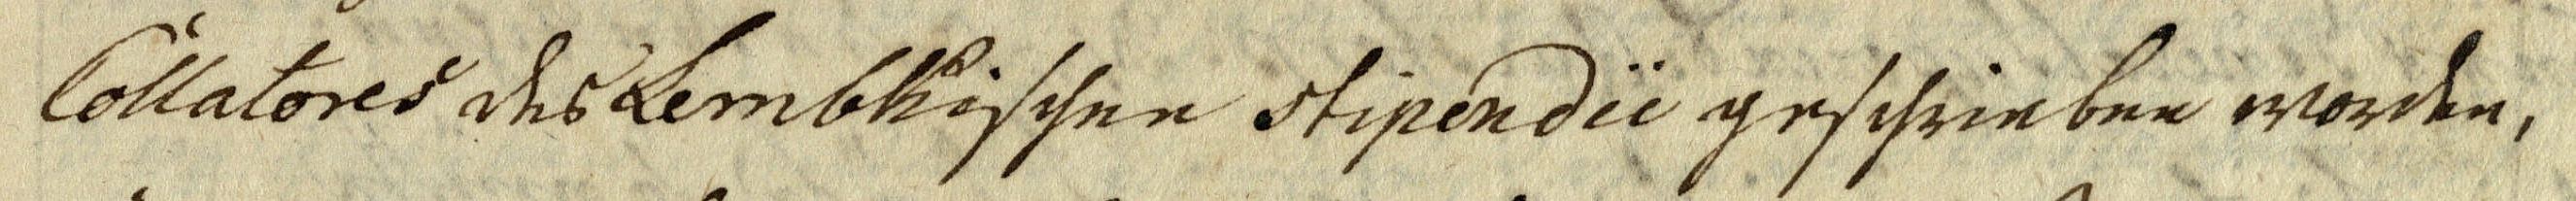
Collatores des Lembkischen stipendii geschrieben worden,
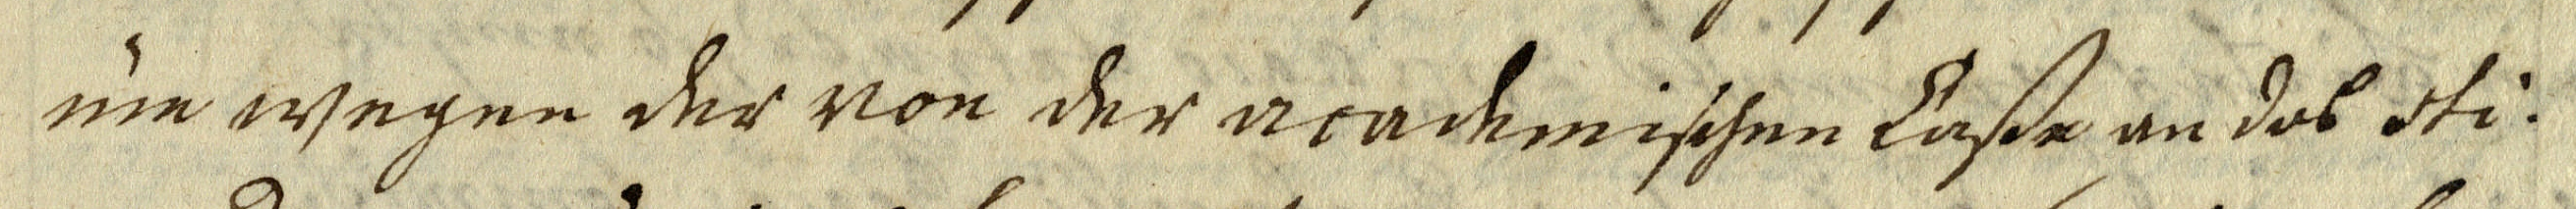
um wegen der von der academischen Caße an das sti¬
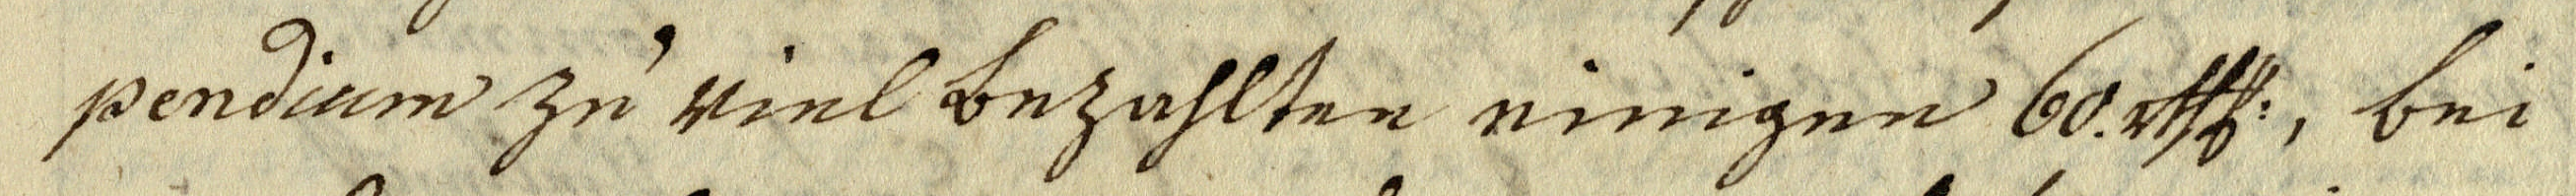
pendium zu viel bezahlten einigen 60 rth., bei
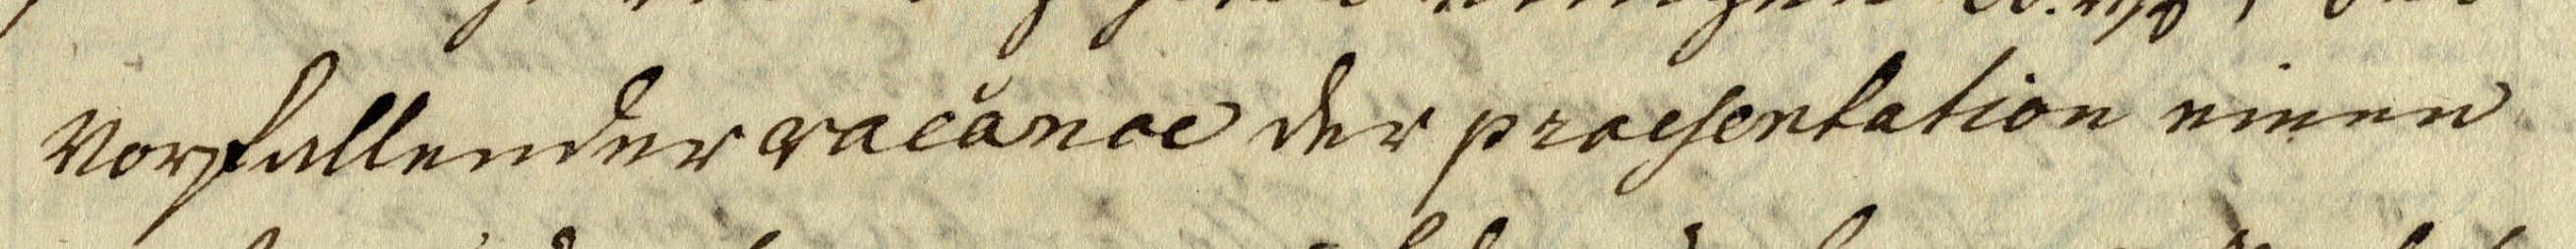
vorfallender vacance der praesentation einen
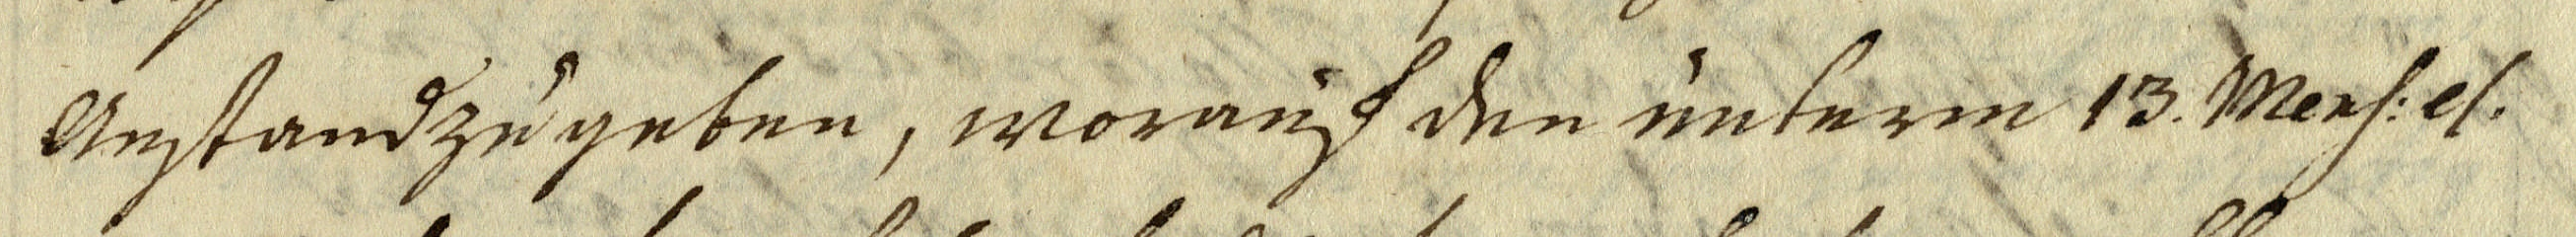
Anstand zu geben, worauf den unterm 13. Mens. e.
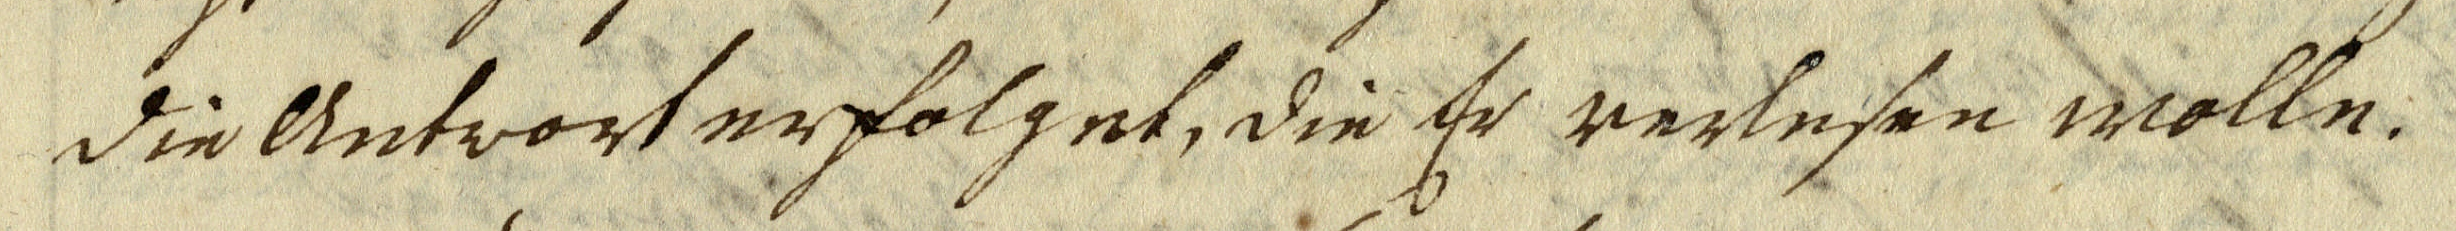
die Antwort erfolget, die Er verlesen wolle.
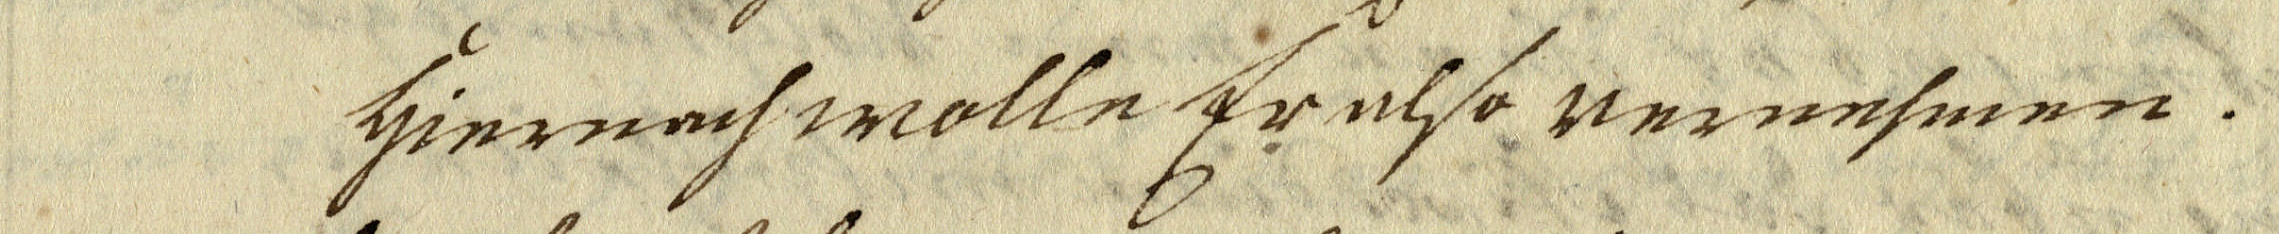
Hiernach wolle Er also vernehmen:
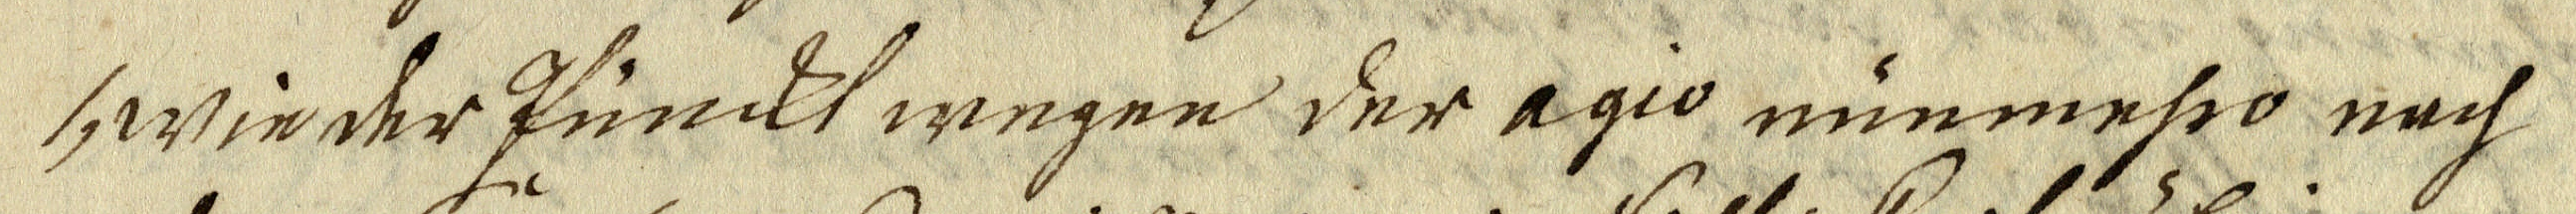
1, wie der Punckt wegen der agio nunmehro nach
